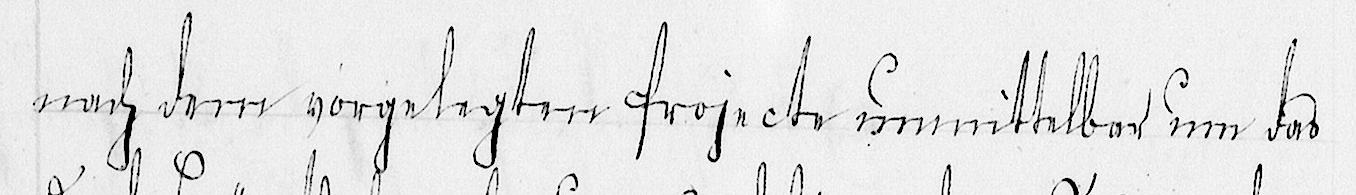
nach dem vorgelegten Projecte unmittelbar um das
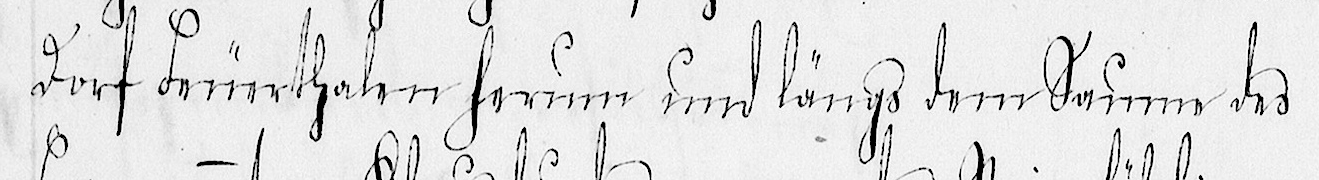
Dorf Feuerthalen herum und längs dem Saume des
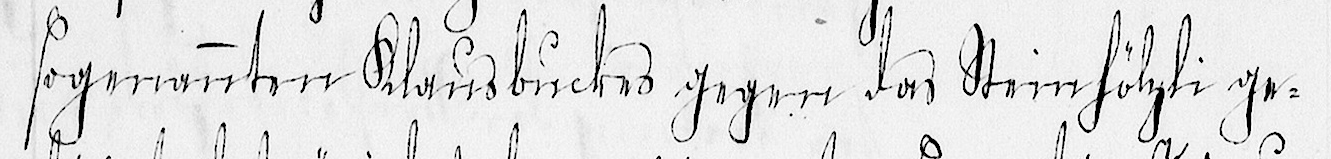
sogenannten Klausbuckes gegen das Steinhölzli ge¬
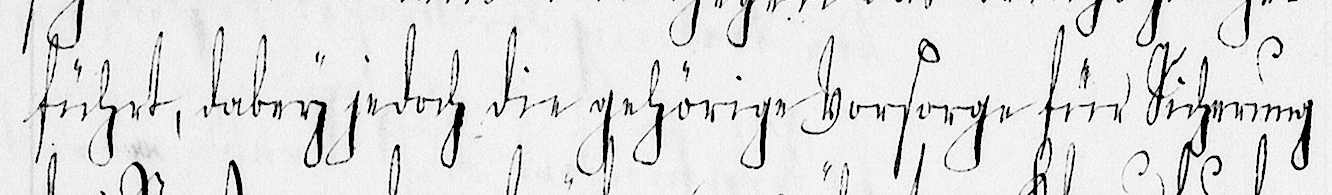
führt, dabey jedoch die gehörige Vorsorge für Sicherung
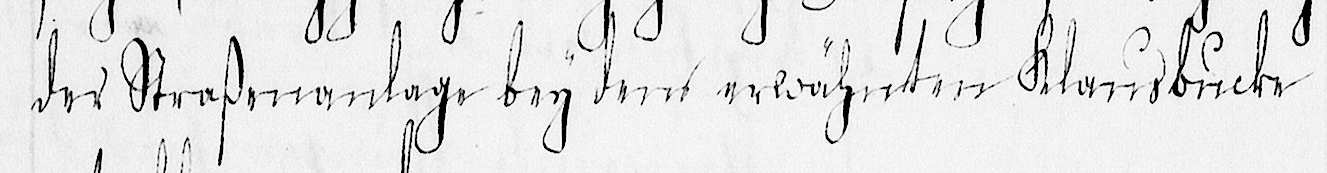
der Straßenanlage bey dem erwähnten Klausbucke
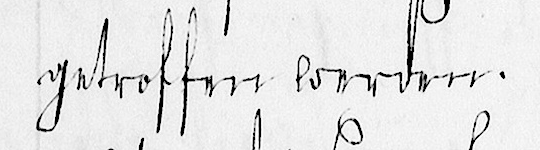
getroffen werden.
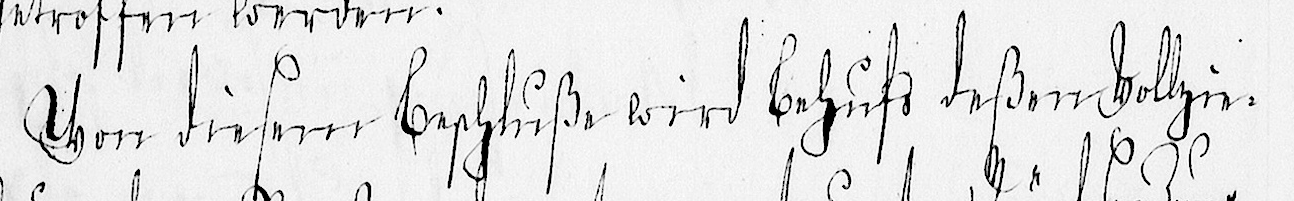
Von diesem Beschluße wird Behufs deßen Vollzie¬
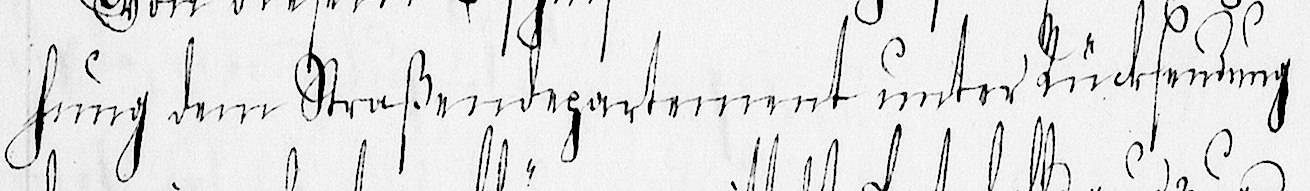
hung dem Straßendepartement unter Rücksendung
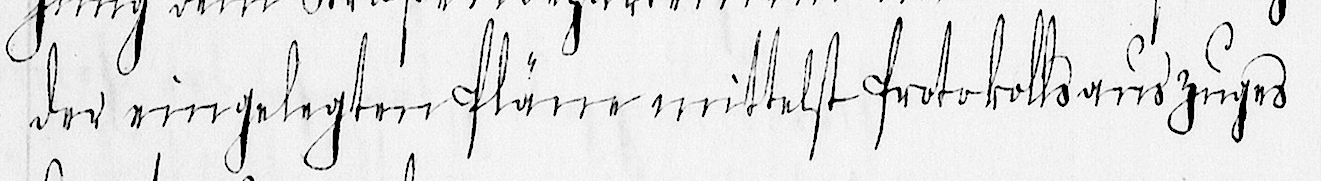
der eingelegten Pläne mittelst Protokollsauszuges
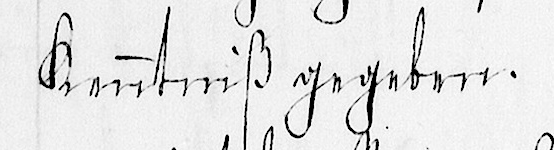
Kenntniß gegeben.
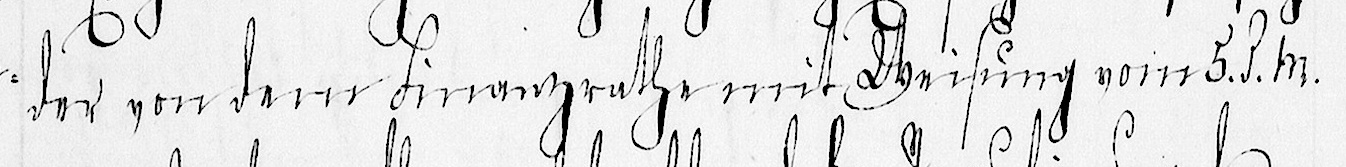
der von dem Finanzrathe mit Weisung vom 5. d. M.
